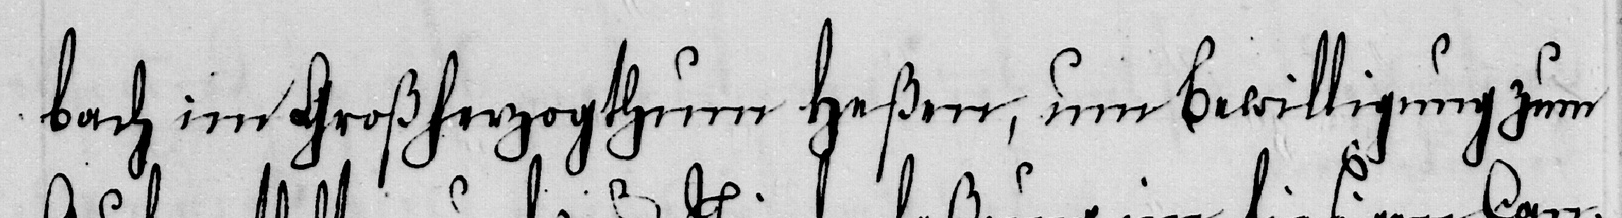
bach im Großherzogthum Heßen, um Bewilligung zum
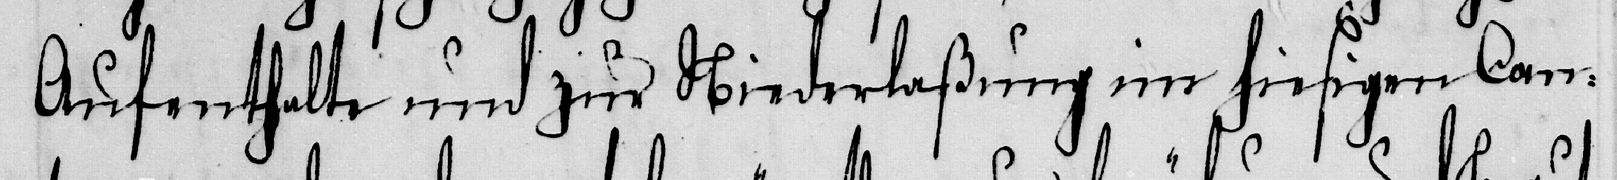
Aufenthalte und zur Niederlaßung im hiesigen Can¬
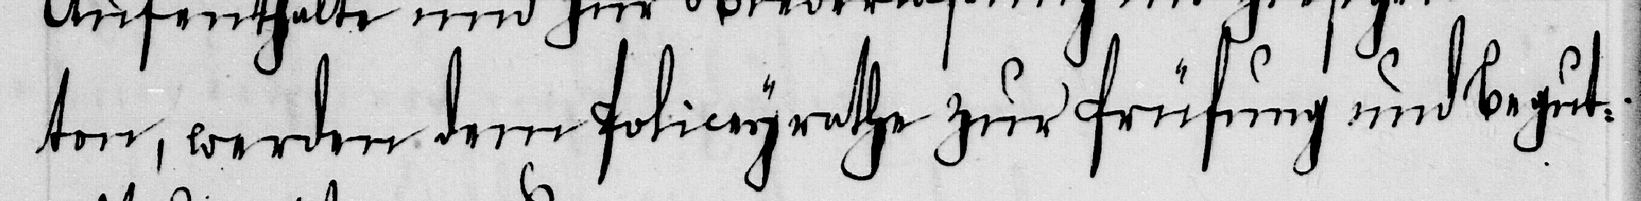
ton, werden dem Policeyrathe zur Prüfung und Begut¬
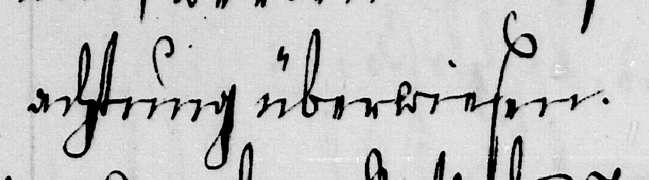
achtung überwiesen.
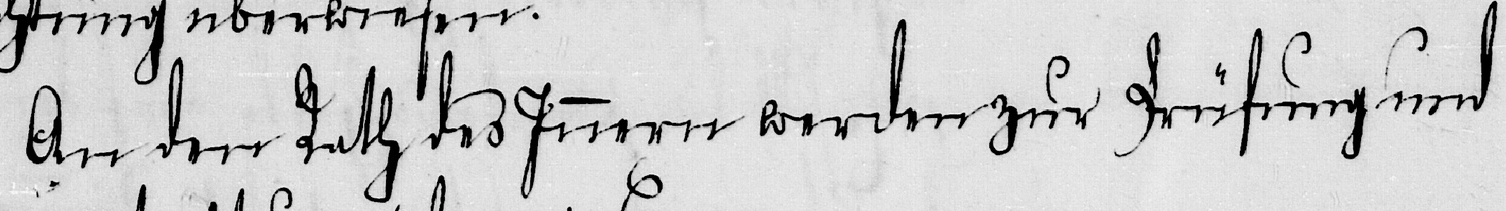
An den Rath des Innern werden zur Prüfung und
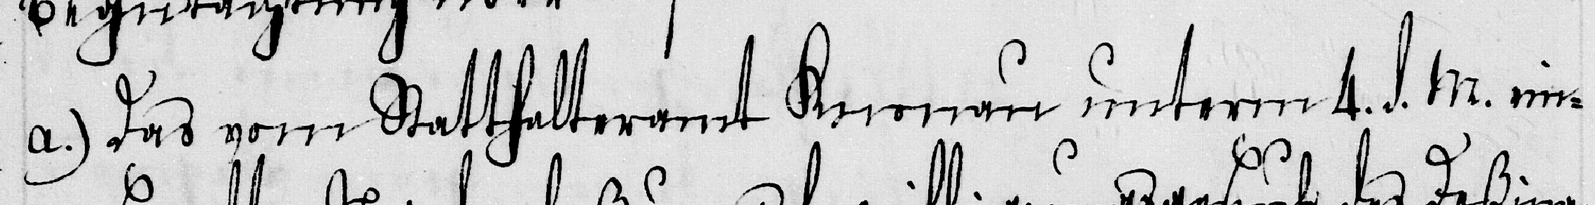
a.) Das vom Statthalteramt Knonau unterm 4. d. M. ein¬
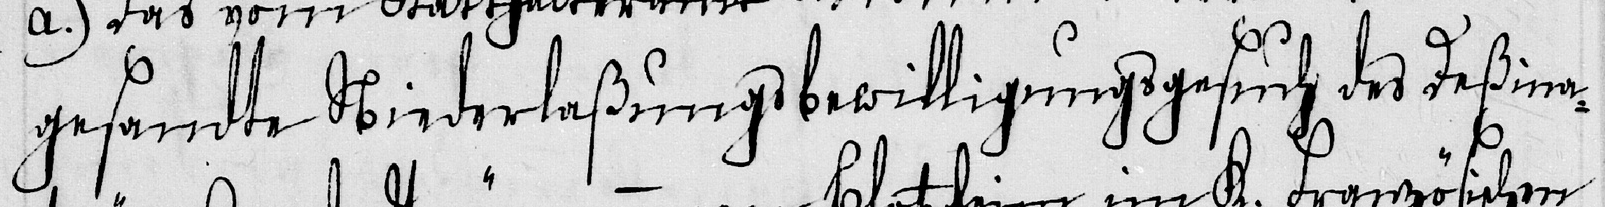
gesandte Niederlaßungsbewilligungsgesuch des Deßina¬
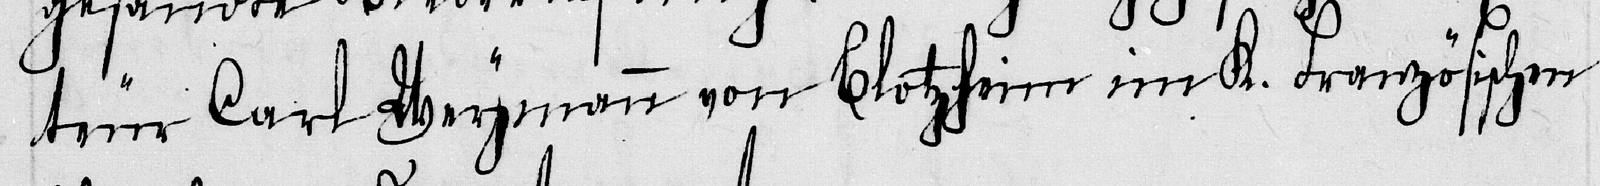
teur Carl Weymann von Blotzheim im K. Französischen
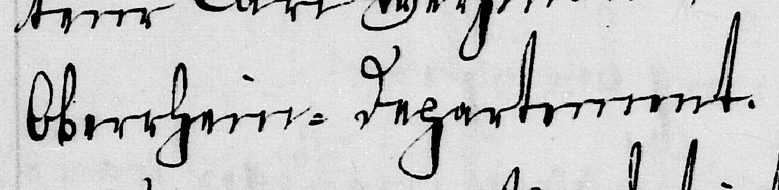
Oberrhein-Departement.
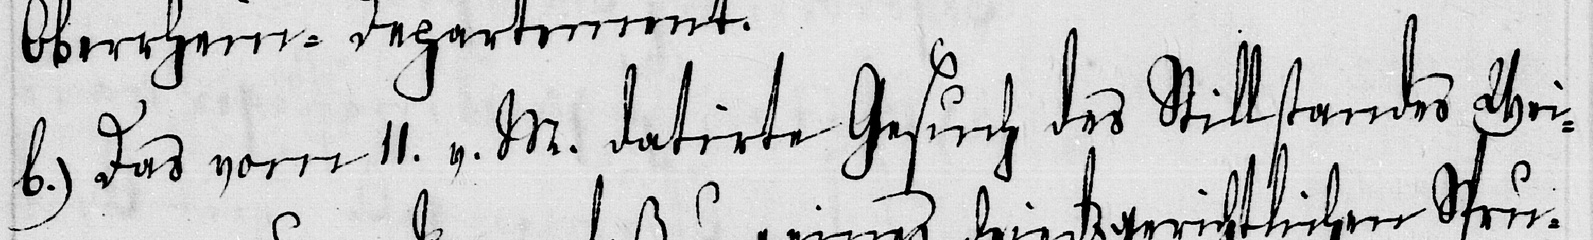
b.) Das vom 11. v. M. datirte Gesuch des Stillstandes Wei¬
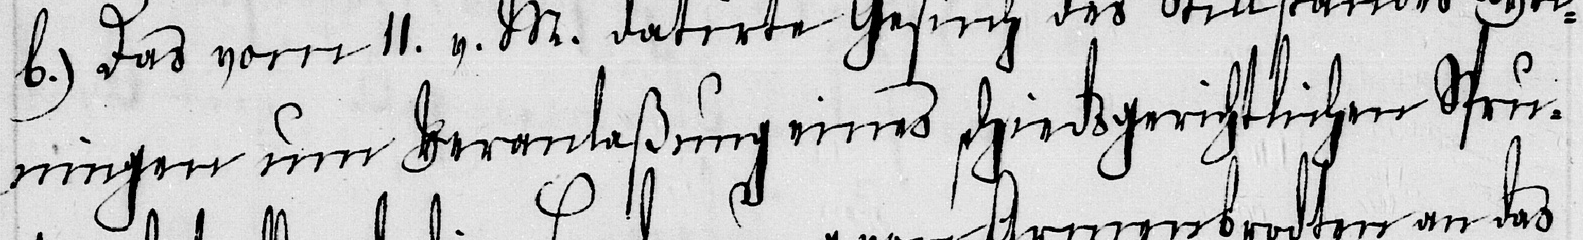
ningen um Veranlaßung eines schiedsgerichtlichen Spru¬
